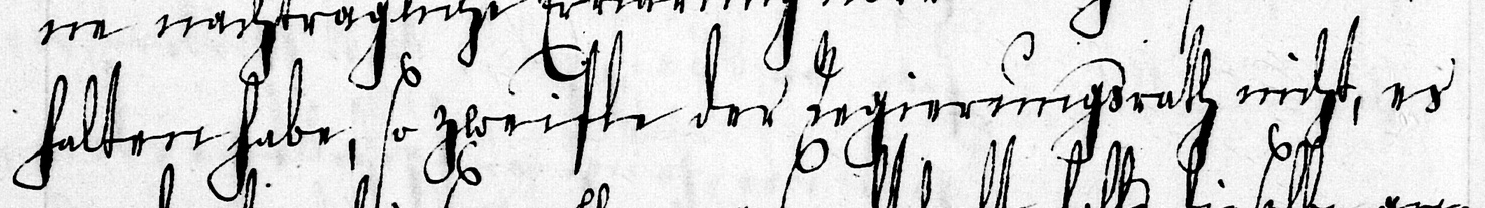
halten habe, so zweifelte der Regierungsrath nicht, es
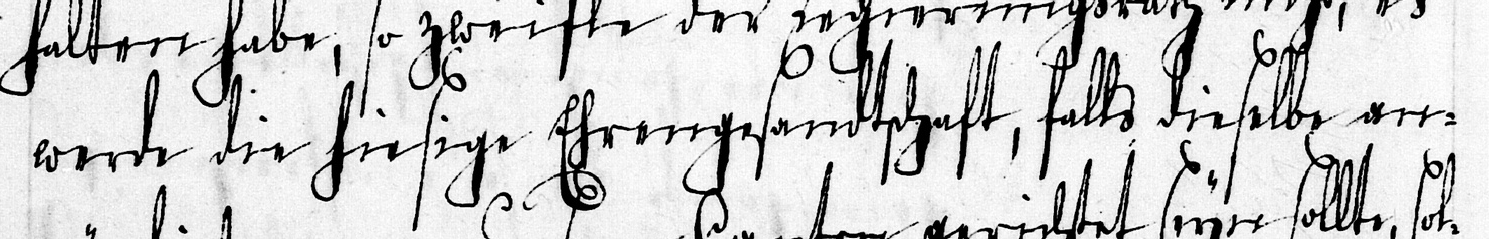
werde die hiesige Ehrengesandtschaft, falls die¬
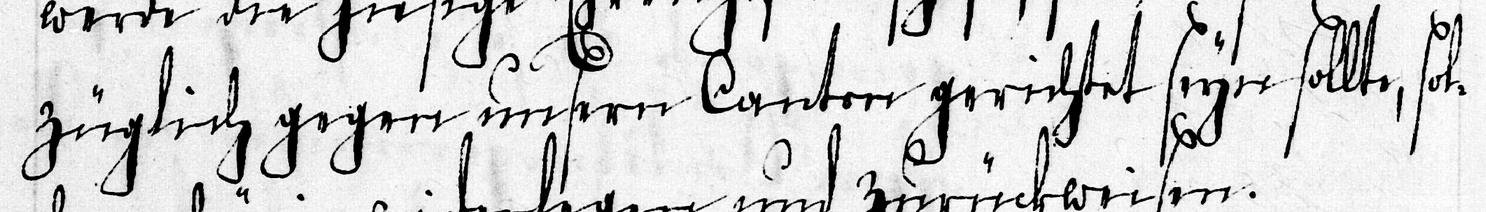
züglich gegen unsern Canton gerichtet seyn sollte, so¬
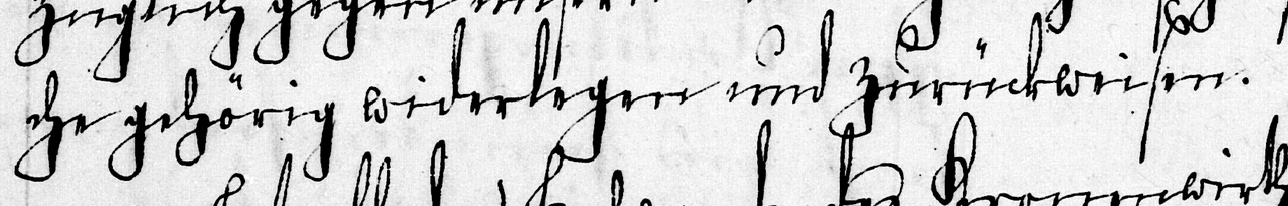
lche gehörig widerlegen und zurückweisen.
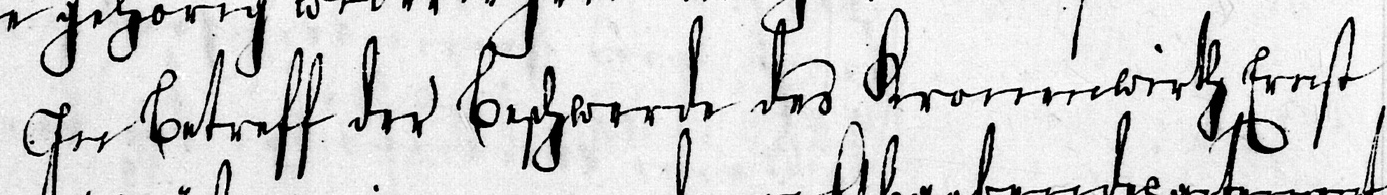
In Betreff der Beschwerde des Kronenwirth Ernst
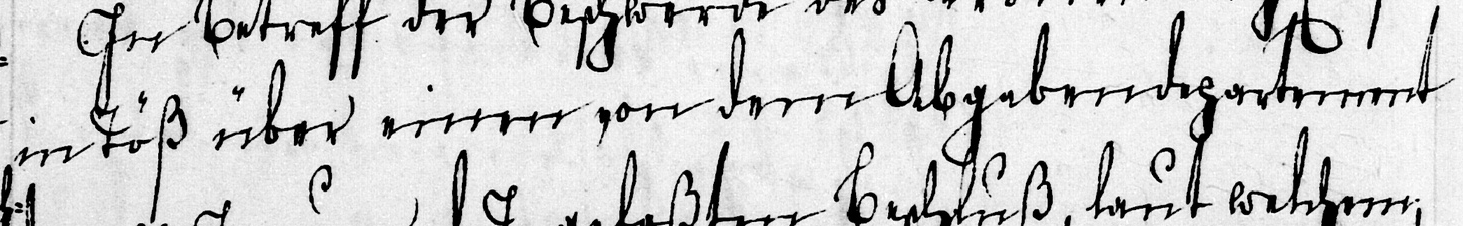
in Töß über einen von dem Abgabendepartement
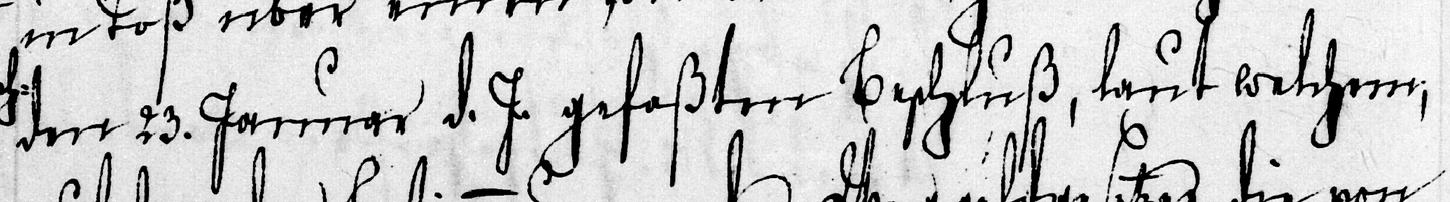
den 23. Januar d. J. gefaßten Beschluß, laut welchem,
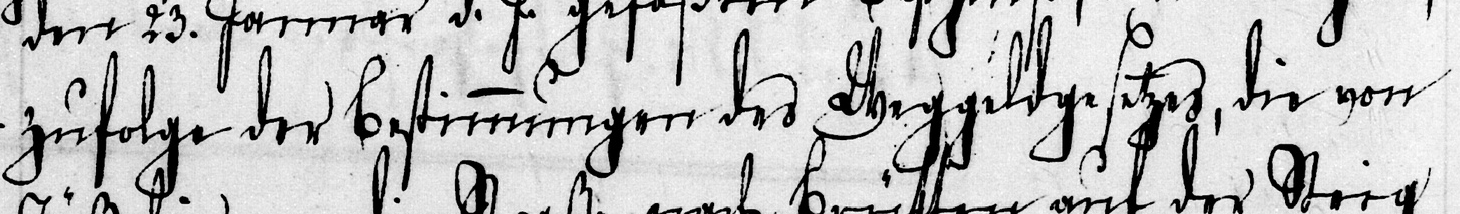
zufolge der Bestimmungen des Weggeldgesetzes, die von
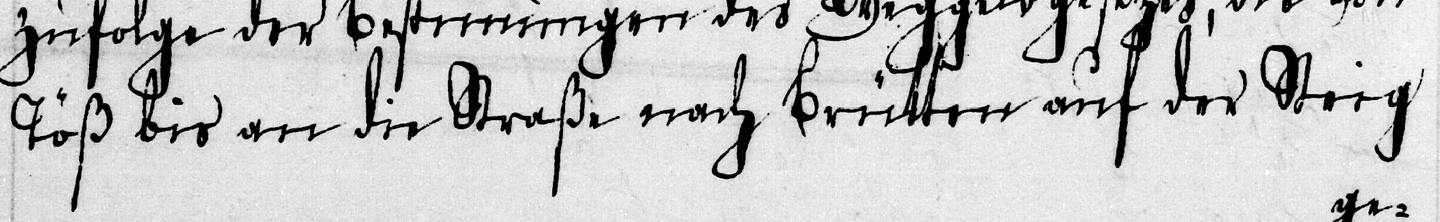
Töß bis an die Straße nach Brütten auf der Steig
